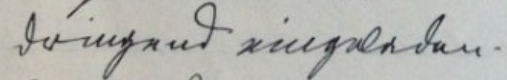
dringend eingeladen.
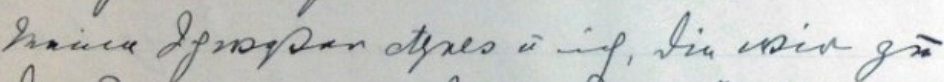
Meine Schwester Agnes u. ich, die wir zu
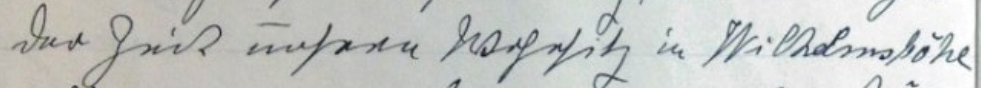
der Zeit unseren Wohnsitz in Wilhelmshöhe
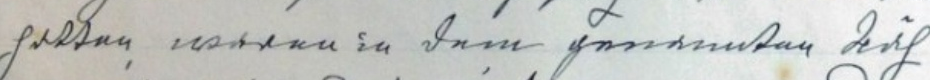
hatten waren in dem genannten Näh
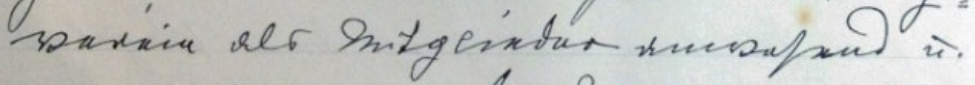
verein als Mitglieder anwesend u.
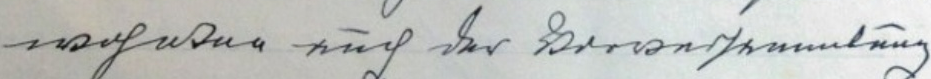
wohnten auch der Versammlung
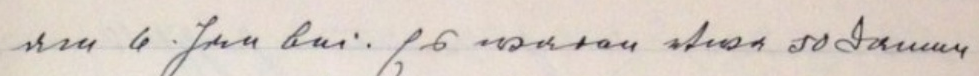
am 6. Jan bei. Es waren etwa 50 Damen
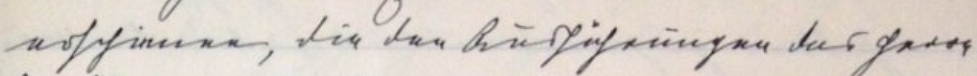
erschienen, die den Ausführungen des Herrn
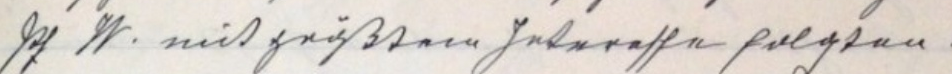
Pf. W. mit größtem Interesse folgten.
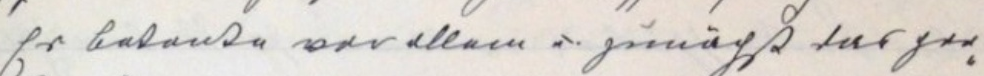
Er beteuerte vor allem u, zunächst das gro
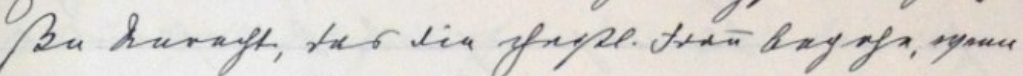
ße Unrecht, das die christl. Frau begehe, wenn
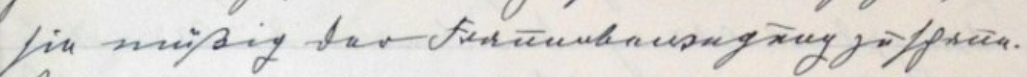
wenn sie müßig der Frauenbewegung zuschaue.
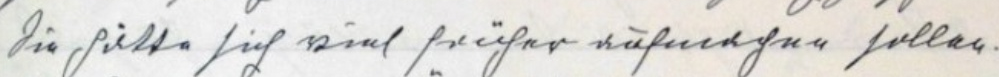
Sie hätte sich mal früher aufmachen sollen.
